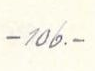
106
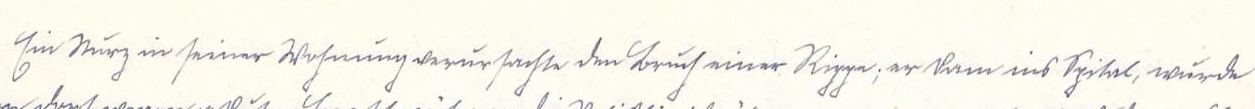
Ein Sturz in seiner Wohnung verursachte den Bruch einer Rippe; er kam ins Spital, wurde
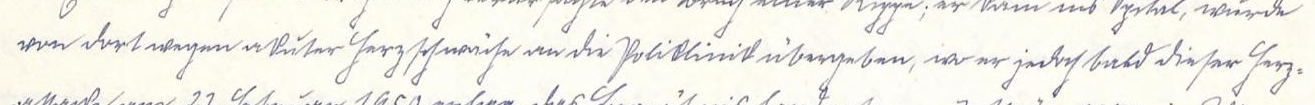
von dort wegen akuter Herzschwäche an die Poliklinik übergehen, wo er jedoch bald dieser Herz-
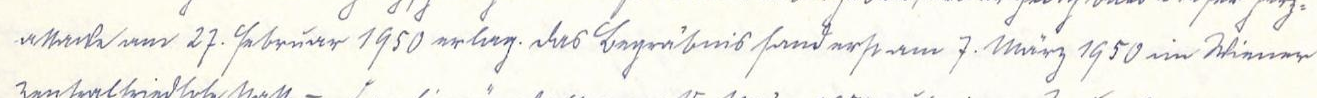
attacke am 27. Februar 1950 erlag. Das Begräbnis fand erst am 7. März 1950 im Wiener
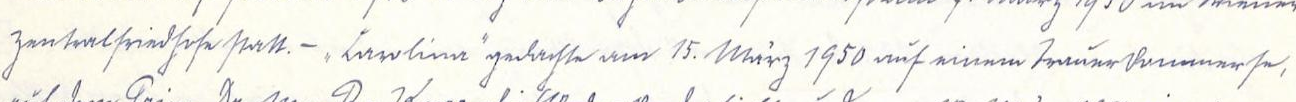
Zentralfriedhofe statt. "Carolina“ gedachte am 15. März 1950 auf einem Trauerkommerse,
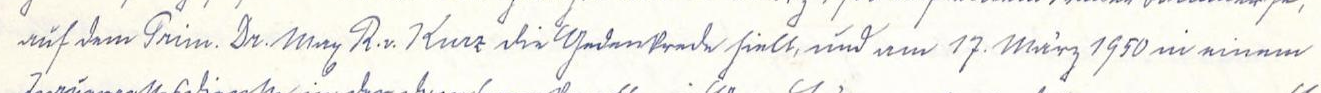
auf dem Prim. Dr. Max R. v. Kurz die Gedenkrede hielt, und am 17. März 1950 in einem
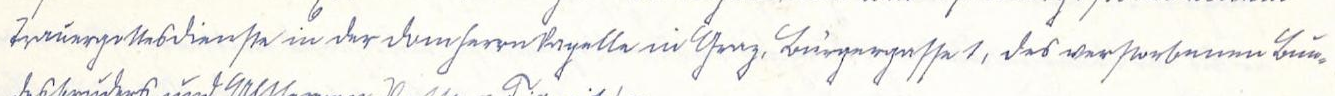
Trauergottesdienst in der Domherrnkapelle in Graz, Bürgergasse 1, des verstorbenen Bun-
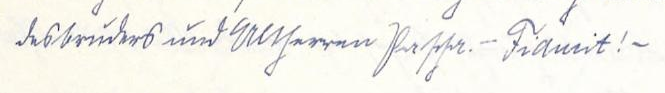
desbruders und Altherren Pascha.- Fiducit!
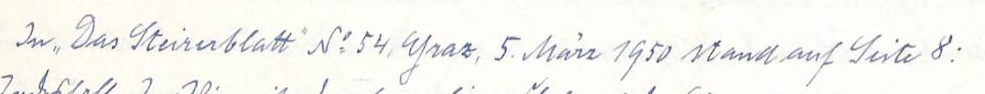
In "Das Steirerblatt" Nr 54 Graz, 5. März 1950 stand auf Seite 8:
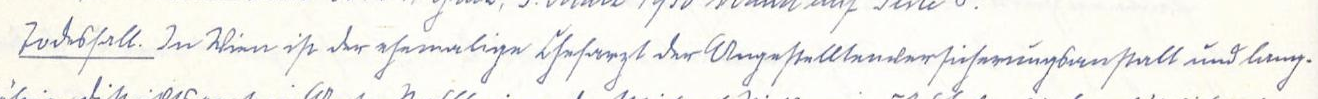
Todesfall. In Wien ist der ehemalige Chefarzt der Angestelltenversicherungsanstallt und lang-
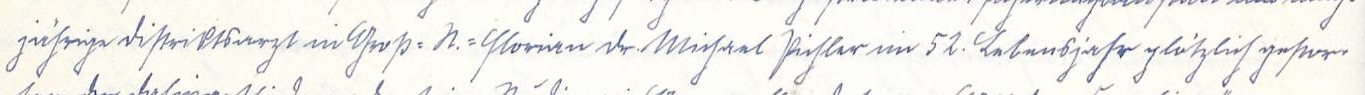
jährige Distriktsarzt in Groß- St. Florian Dr. Michael Pichler im 52. Lebensjahr plötzlich gestor-
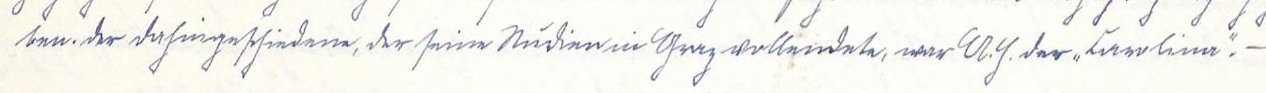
ben. Der Dahingeschiedene, der seine Studien in Graz vollendete, war AH der „Carolina“.-
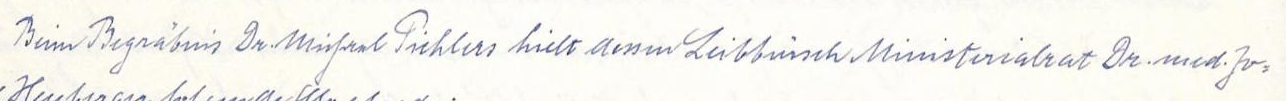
Beim Begräbnis Dr. Michael Pichlers hielt dssen Leibbursch Ministerialat Dr. med. Jo-
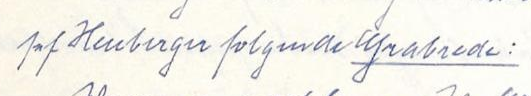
sef Hamberger folgende Grabrede:
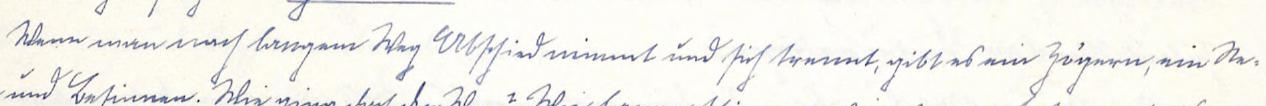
Wenn man nach langem Weg Abschied nimnmt und sich trennt, gibt es ein Zögern, ein Ste-
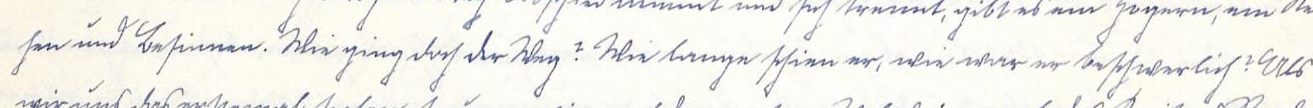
hen und Besinnen. Wie ging doch der Weg?. Wie lange schien er, wie war er beschwerlich? Als
